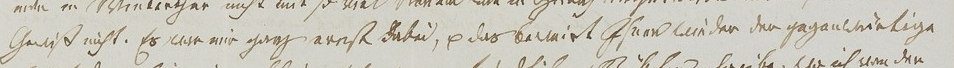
Gewiß nicht. Es war mir ganz ernst dabei, & das beweist Ihnen wieder der gegenwärtige
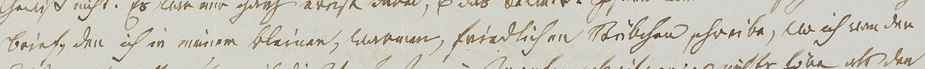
Brief, den ich in meinem kleinen, warmen, friedlichen Stübchen schreibe, wo ich von der
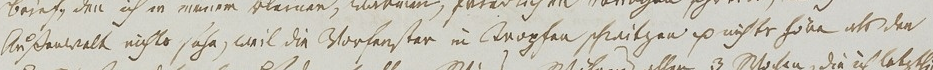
Außenwelt nichts sehe, weil die Vorfenster in Tropfen schwitzen & nichts höre als den
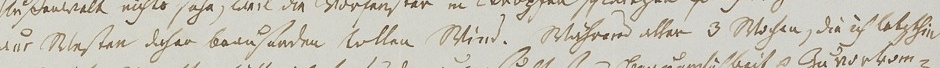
aus Westen daher brausenden tollen Wind. Während aller 3 Wochen, die ich letzthin
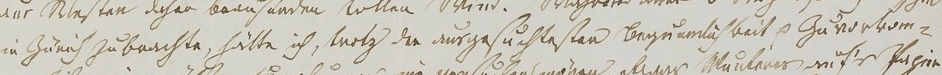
in Zürich zubrachte, hätte ich, trotz der ausgesuchtesten Bequemlichkeit & Zuvorkom-
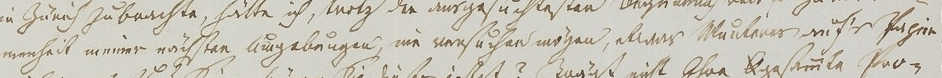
menheit meiner nächsten Umgebungen, nie versuchen mögen, etwas Munteres auf's Papier
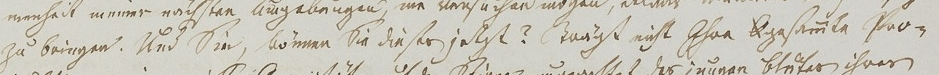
zu bringen. Und Sie, können Sie dieses jetzt? Trägt nicht Ihre A gesammte Pro-
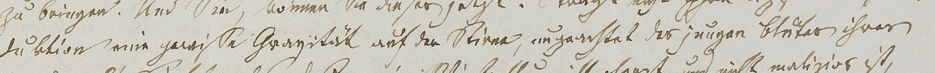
duktion eine gewisse Gravität auf der Stirne, ungeachtet des jungen Blutes ihres
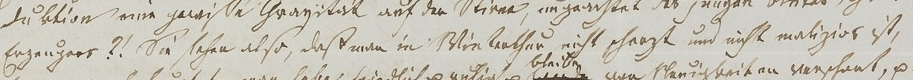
Erzeugers?! Sie sehen also, daß man in Winterthur nicht scherzt und nicht malizios ist,
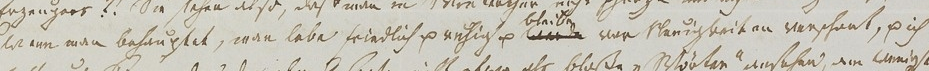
wenn man behauptet, man lebe friedlich & ruhig & werdebleibe vor Neuigkeiten verschont, & ich
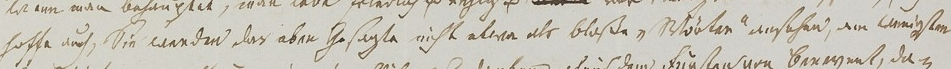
hoffe auch, Sie werden das oben Gesagte nicht etwa als bloße «Wörter» ansehen, am wenigsten
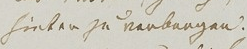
hinter zu verbergen.
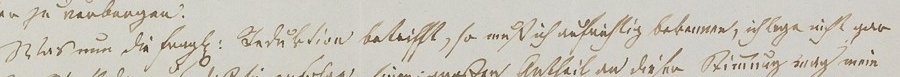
Was nun die fragl: Reduktion betrifft, so muß ich aufrichtig bekennen, ich lege nicht gar
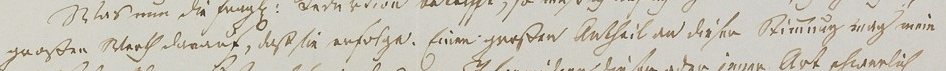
großen Werth darauf, daß sie erfolge. Einen großen Antheil an dieser Stimmung mag mein
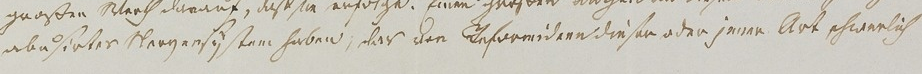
abusirtes Nervensystem haben; das von Reformideen dieser oder jener Art schwerlich
